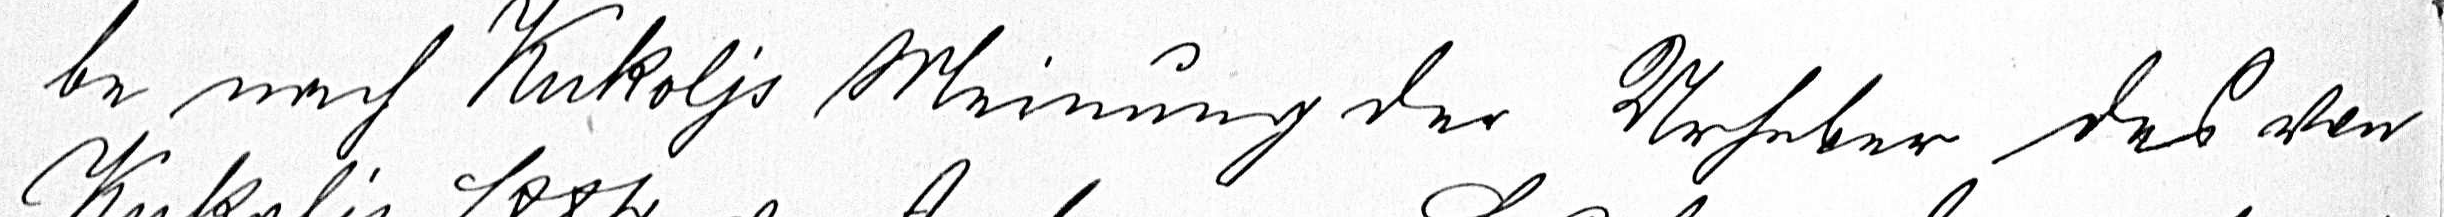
be nach Kukolj’s Meinung der Urheber des von
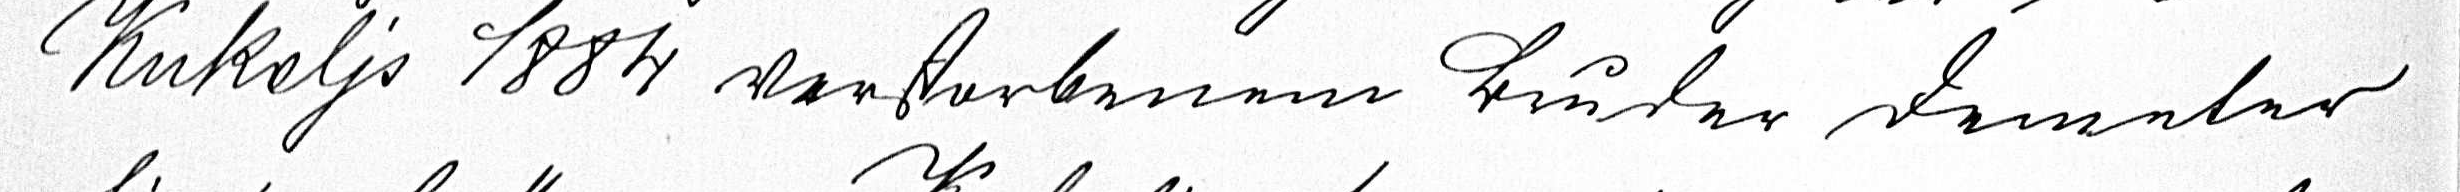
Kukoljs 1884 verstorbenen Bruder Demeter
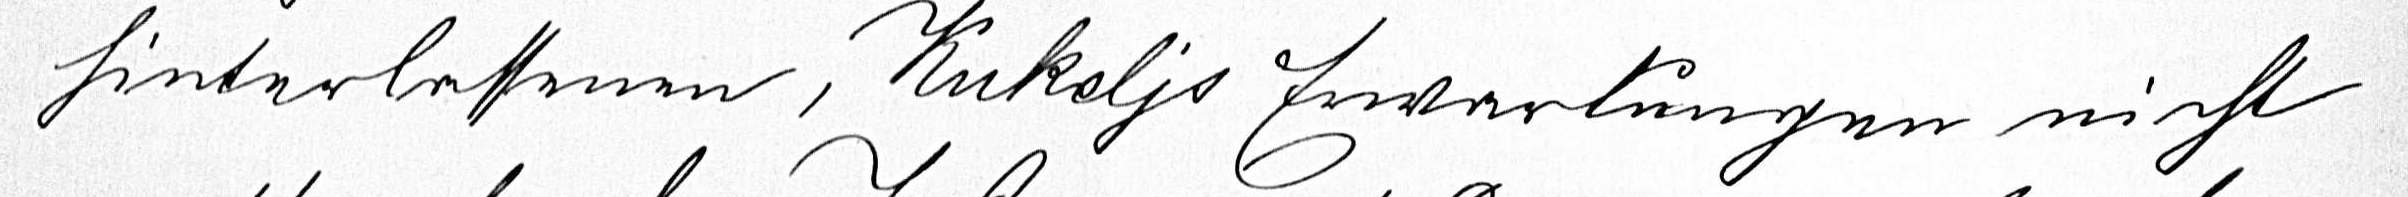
hinterlassenen, Kukoljs Erwartungen nicht
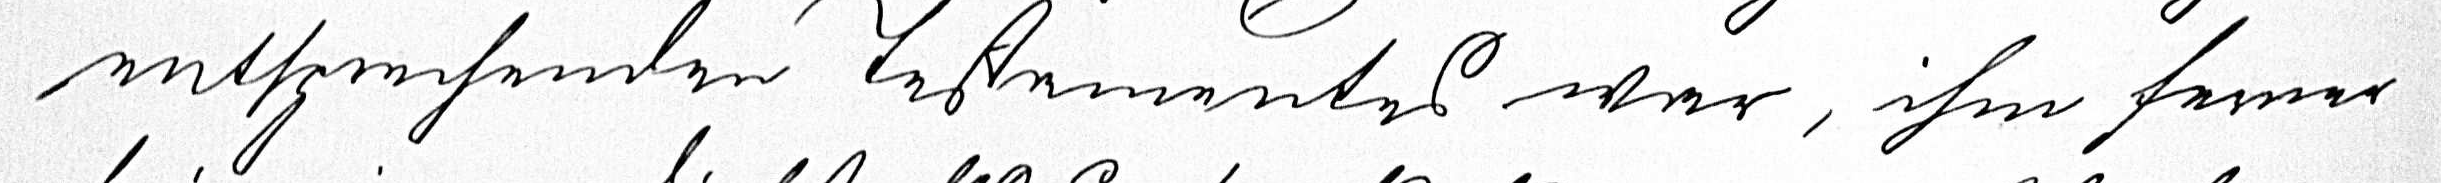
entsprechenden Testamentes war, ihm ferner
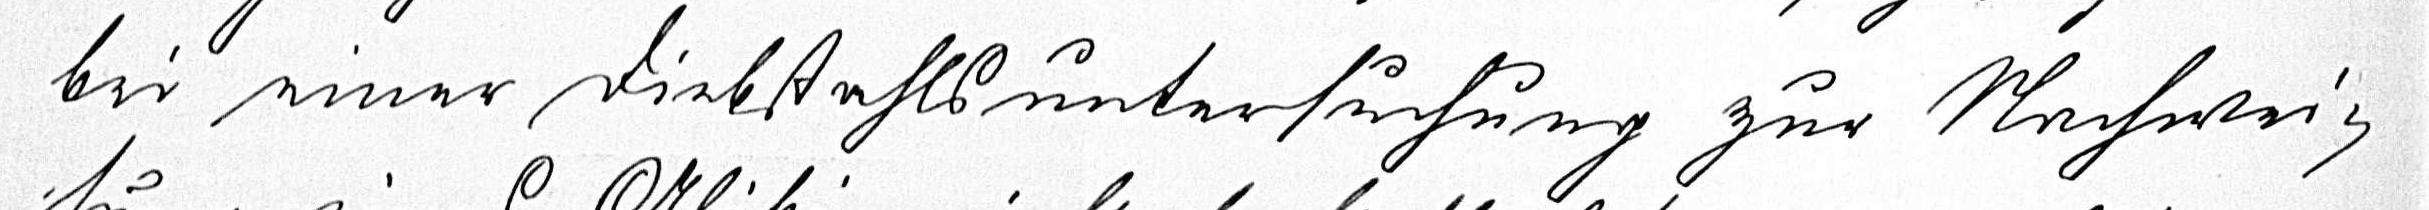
bei einer Diebstahlsuntersuchung zur Nachwei¬
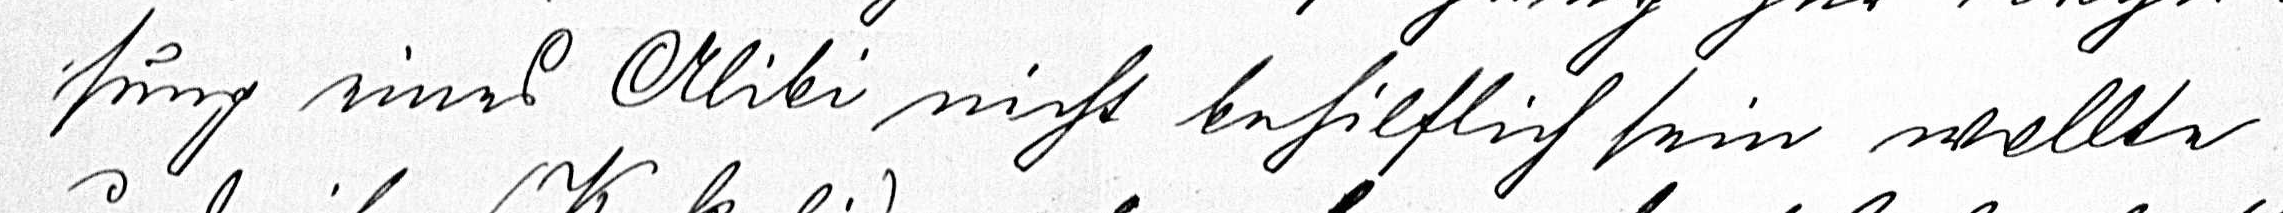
sung eines Alibi nicht behilflich sein wollte
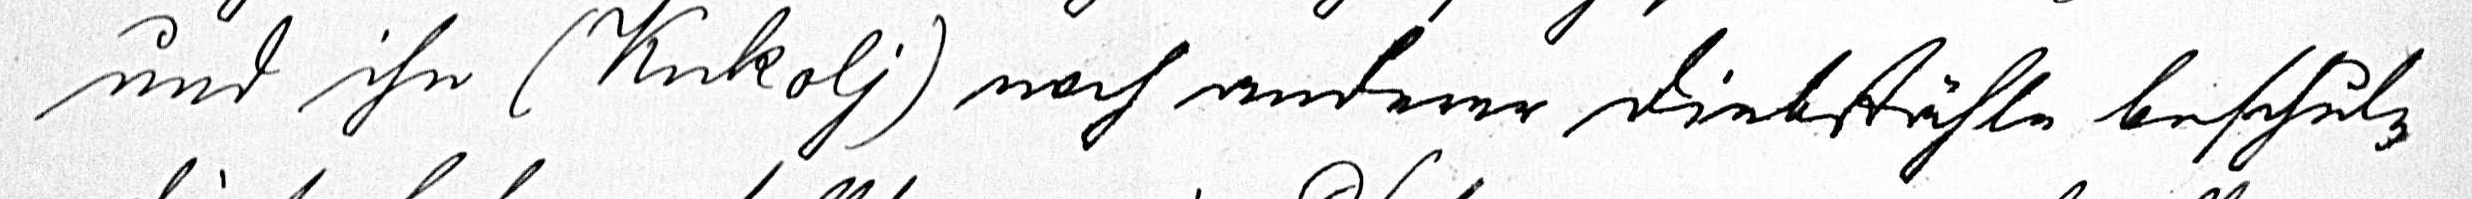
und ihn (Kukolj) nach andere Diebstähle beschul¬
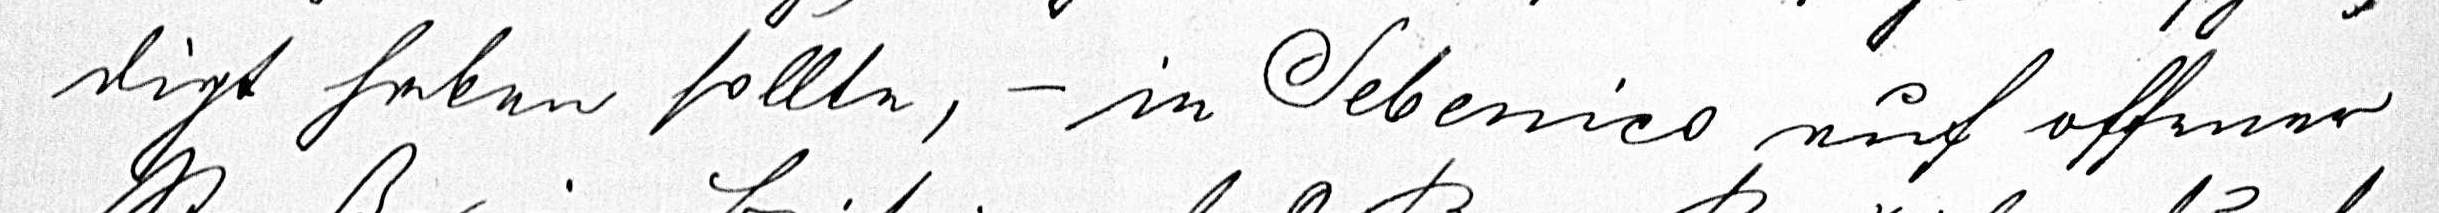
digt haben sollte, – in Sebenice auf offener
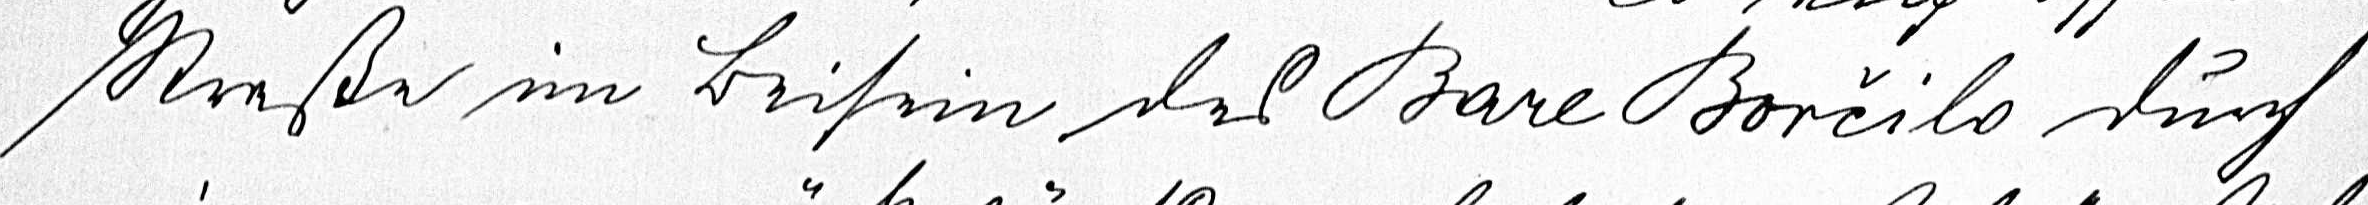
Straße in Beisein des Bare Borčilo durch
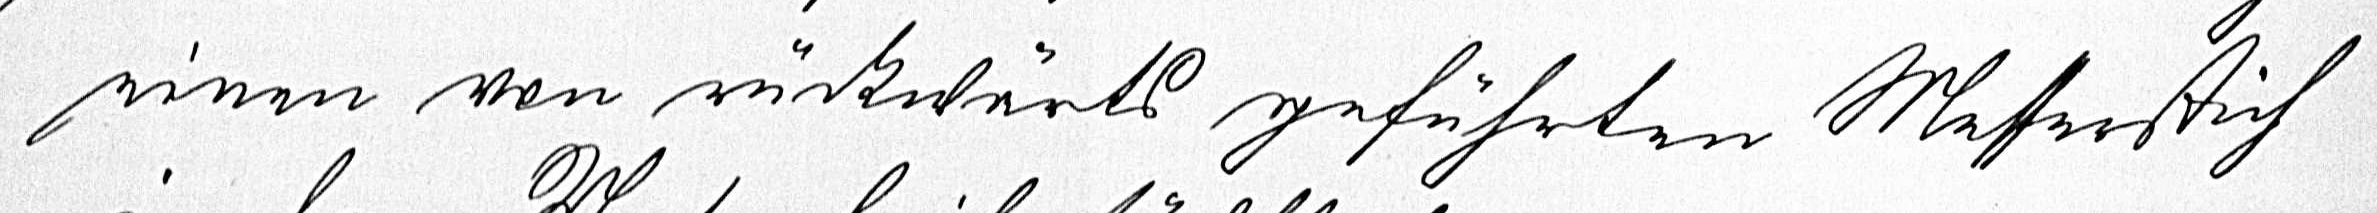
einen von rückwärts geführten Messerstich
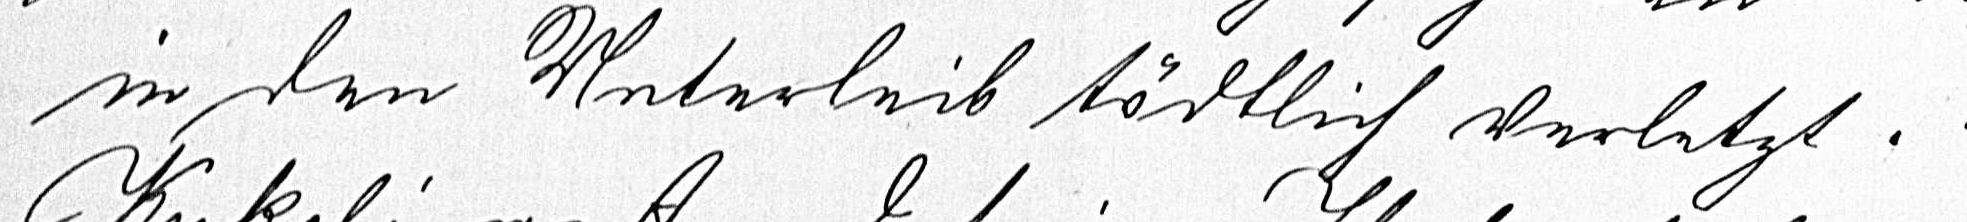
in den Unterleib tödlich verletzt.
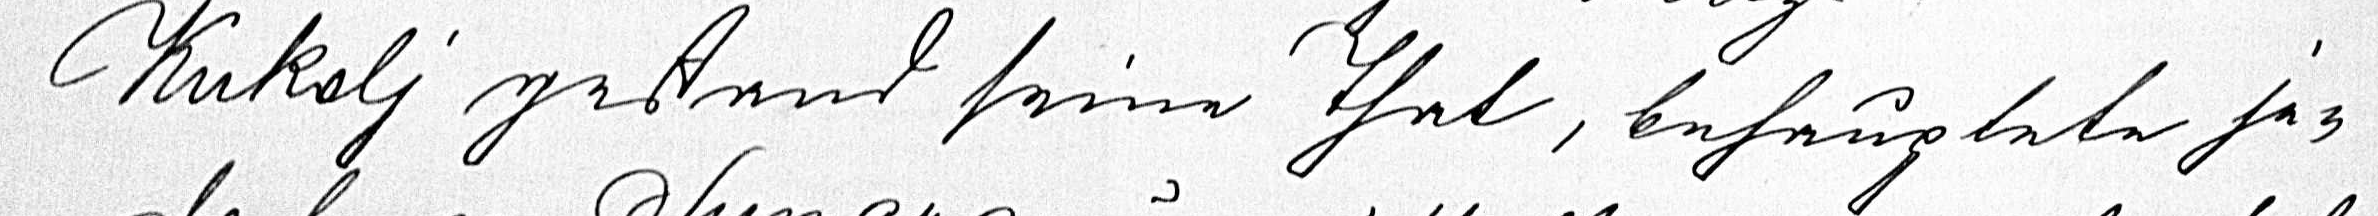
Kukolg gestand seine That, behauptete je¬
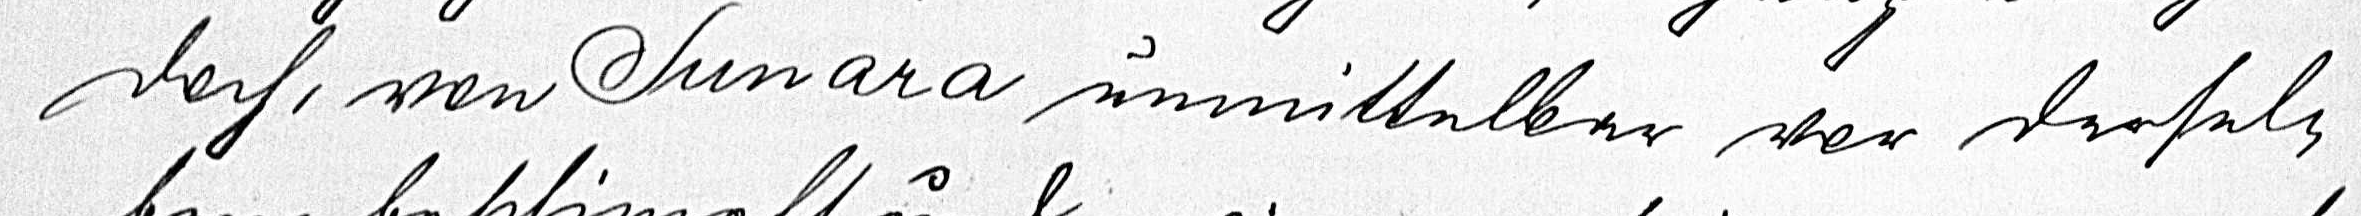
doch, von Sunara unmittelbar vor dersel¬
